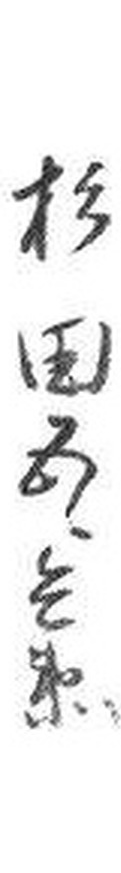杉田五郎兵衛
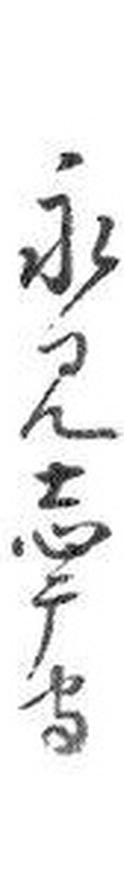永見志摩守
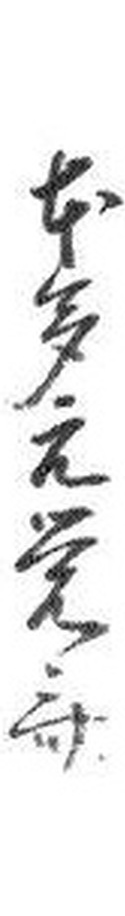本多元覚斎
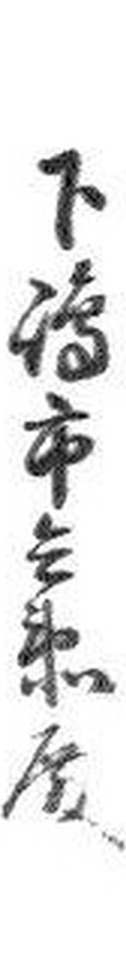下嶋市兵衛殿
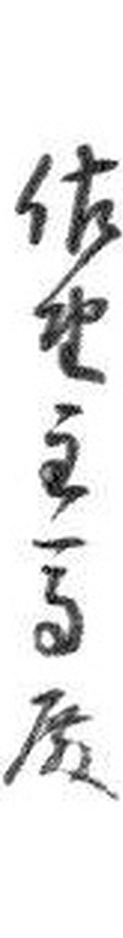佐野主馬殿
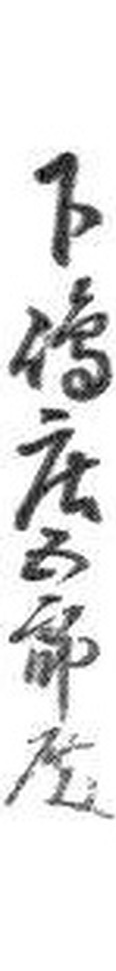下嶋庄五郎殿

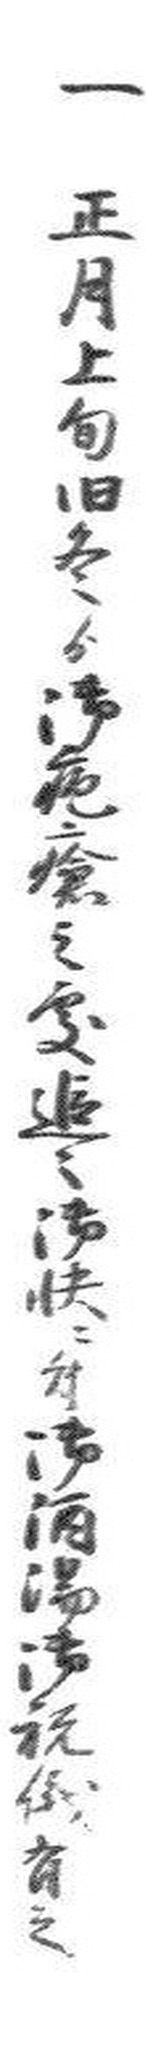一正月上旬旧冬ゟ御疱瘡之処追々御快ニ付御酒湯御祝儀有之
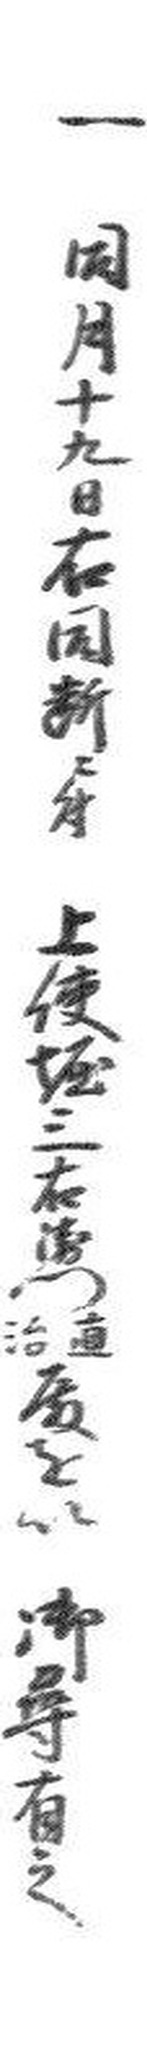一同月十九日右同断ニ付上使堀三右衛門直治殿を以御尋有之
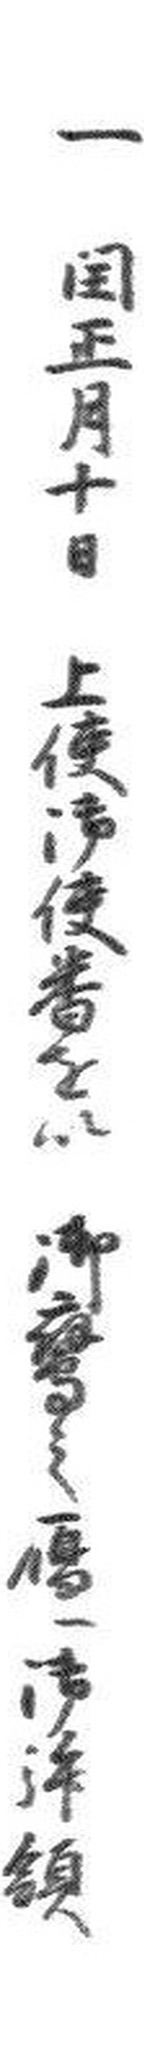一閏正月十日上使御使番を以御鷹之雁一御拝領
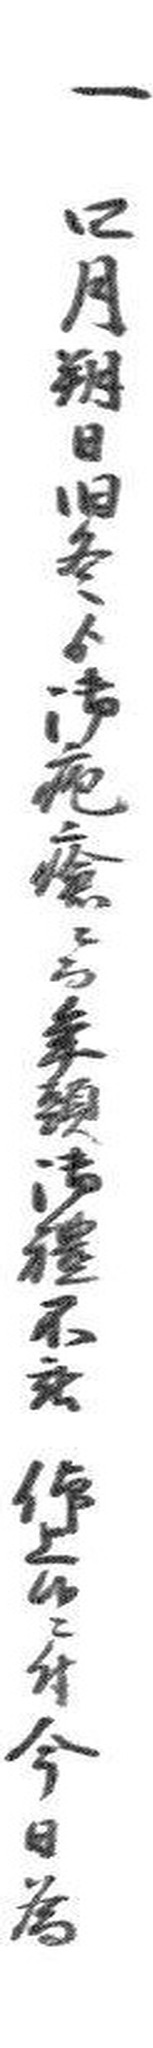一四月朔日旧冬ゟ御疱瘡ニ而年頭御礼不被仰上候ニ付今日為
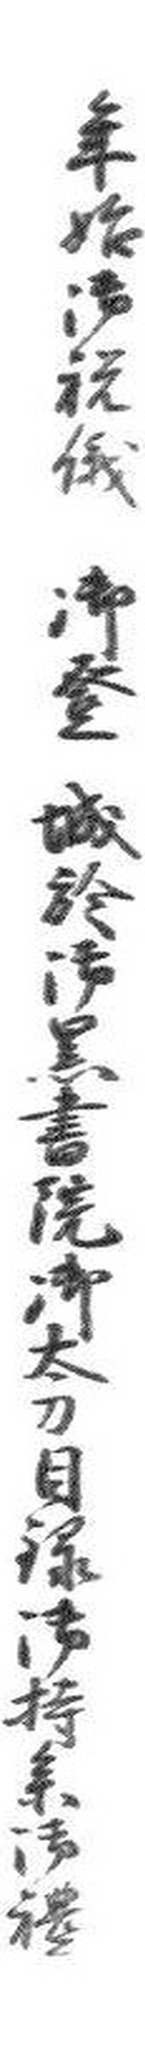年始御祝儀御登城於御黒書院御太刀目録御持参御礼
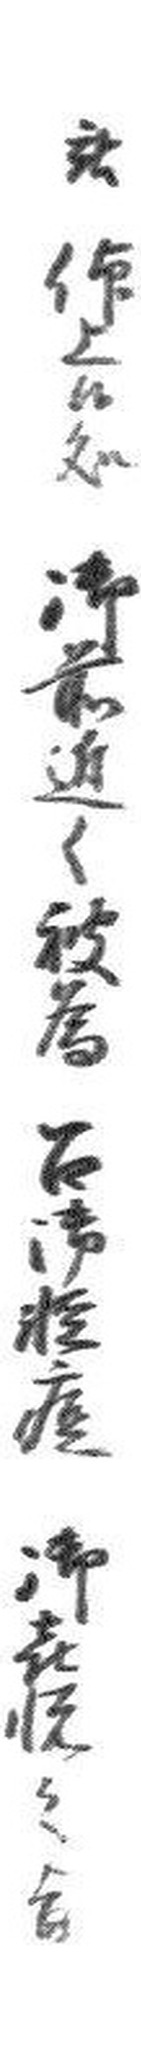被仰上候処御前近く被為召御軽痘御喜悦之旨
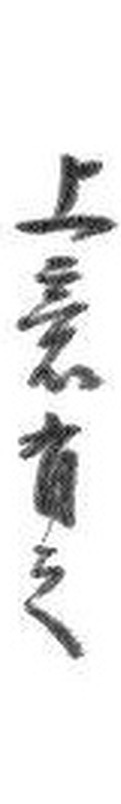上意有之

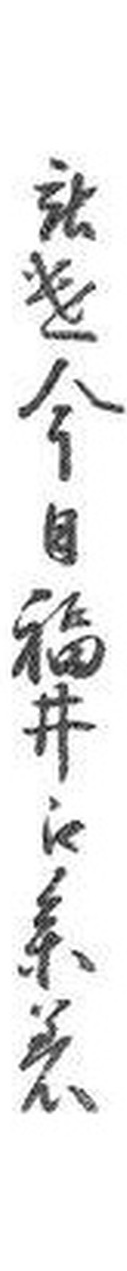被遣今日福井江参着
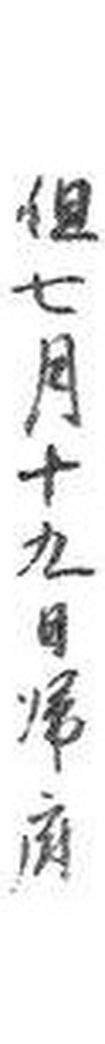但七月十九日帰府
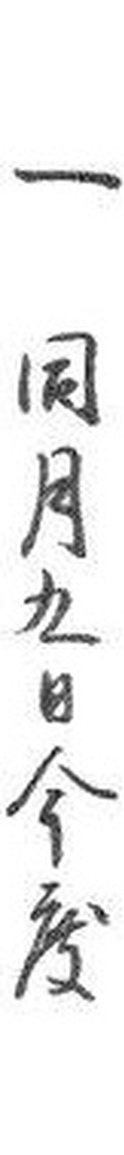一同月九日今度」
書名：家譜 五 光通公 従寛永十三年到万治二年
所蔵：福井県文書館 Fukui Prefectural Archives
